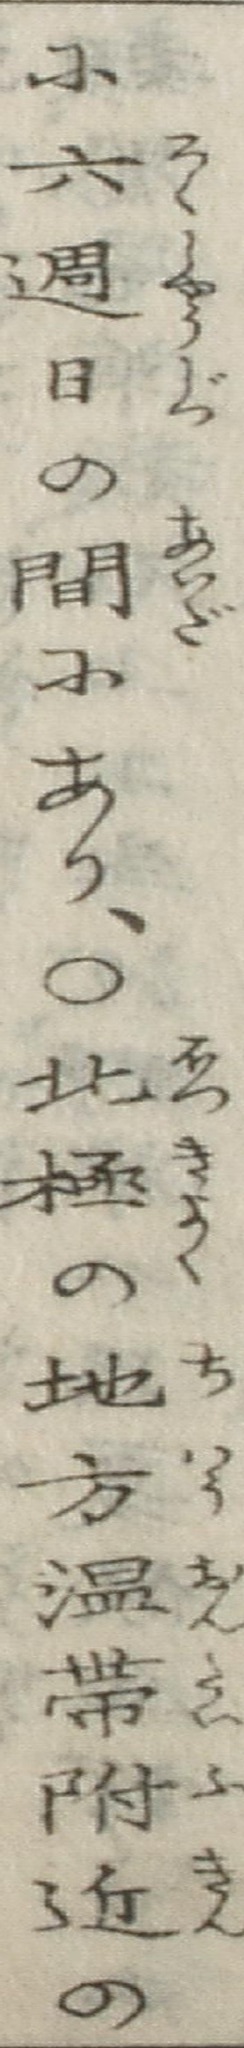に六週日の間にあり、〇北極の地方温帯付近の
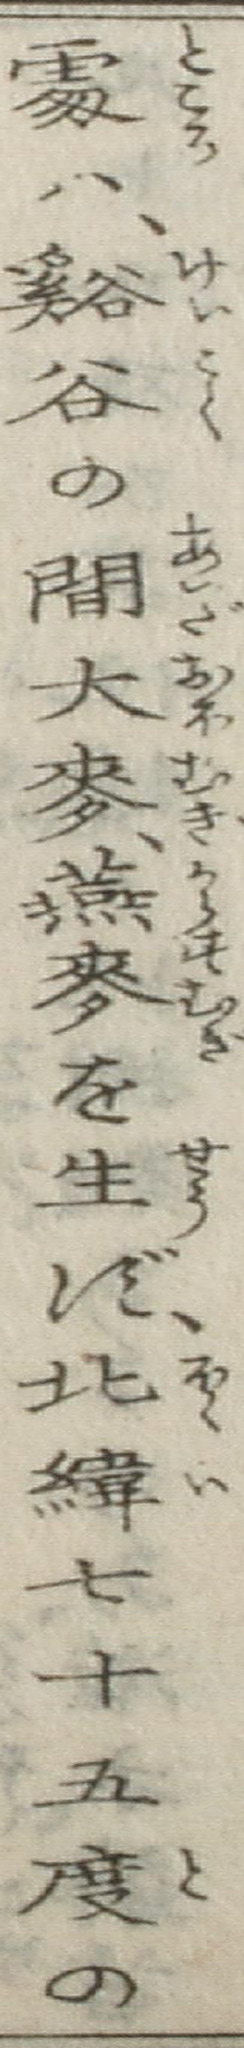処は、谿谷の間大麦、燕麦を生ず、北緯七十五度の
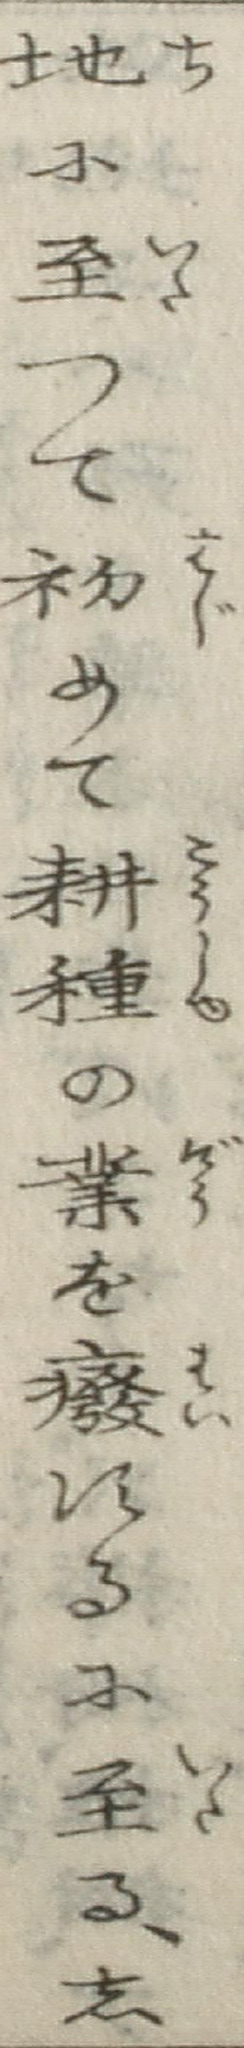地に至つて初めて耕種の業を廃するに至る、し
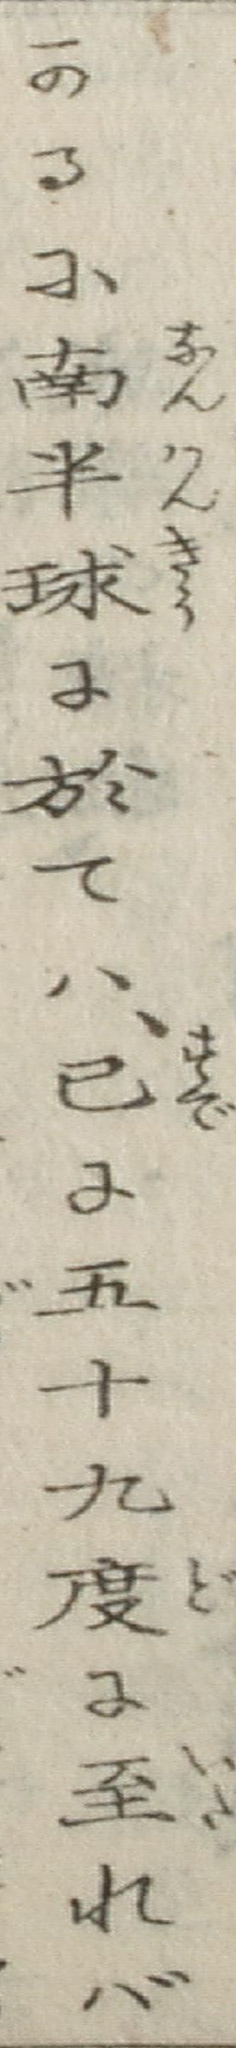かるに南半球に於ては、巳に五十九度に至れば
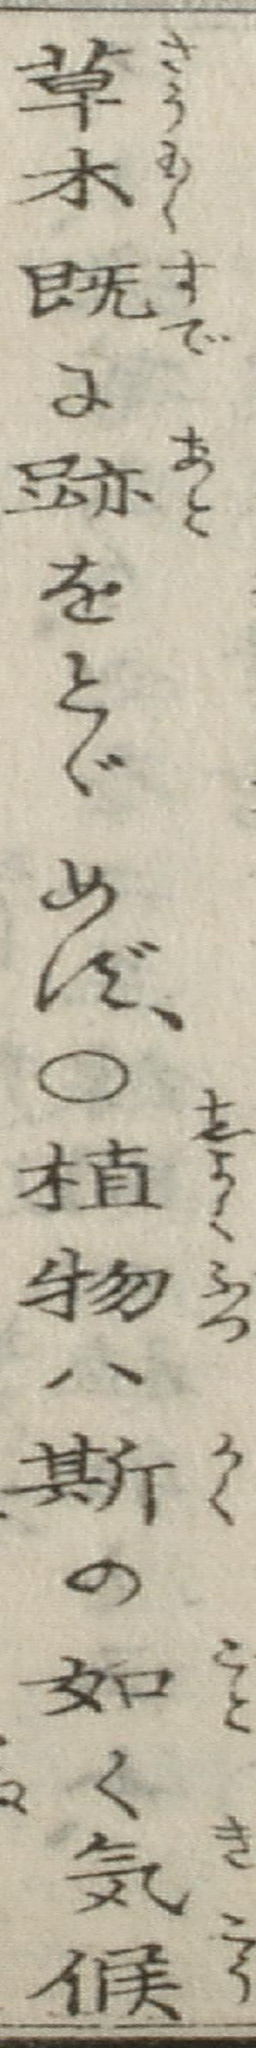草木既に跡をとゞめず、〇植物は斯の如く気候
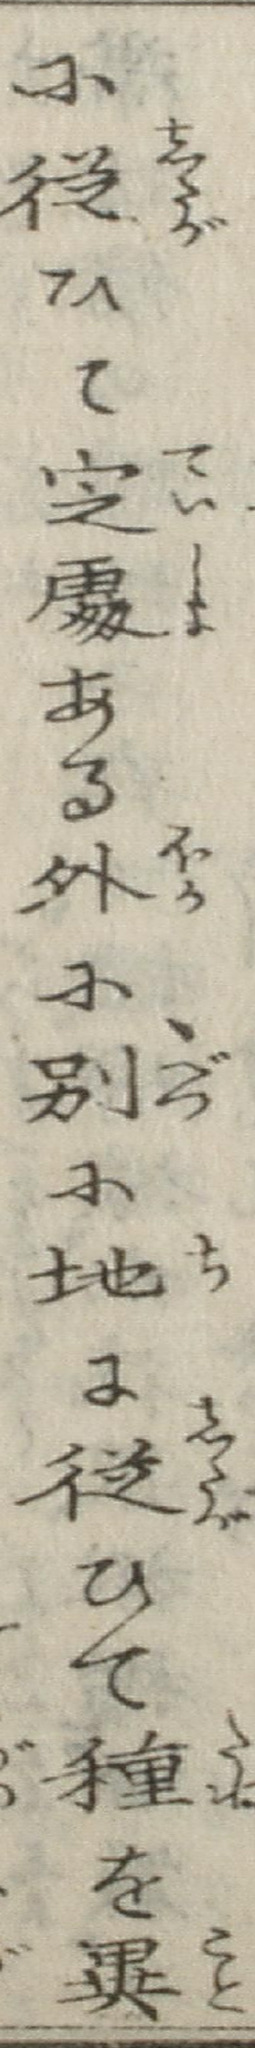に従ひて定処ある外に、別に地に従ひて種を異
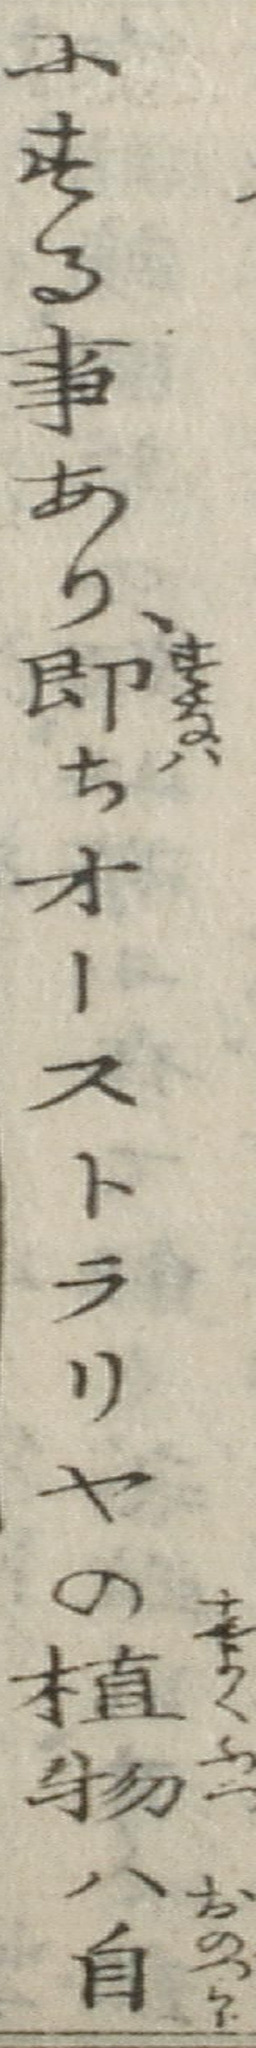にする事あり、即ちオーストラリアの植物は自
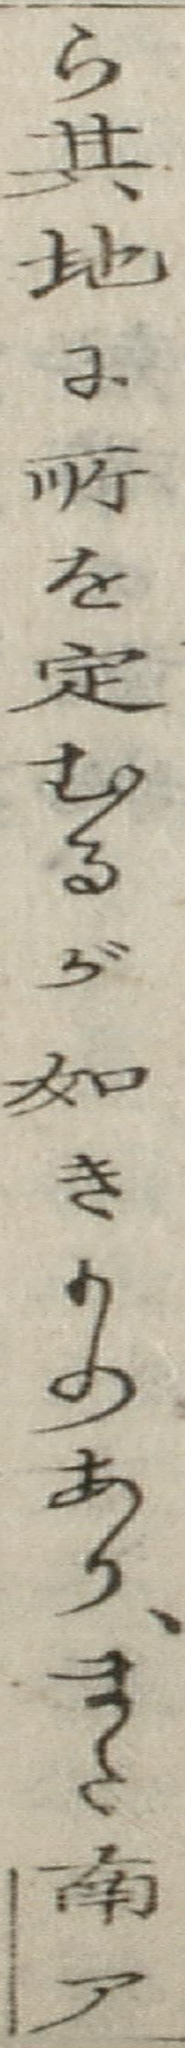ら其地に所を定むるがごときものあり、また南ア
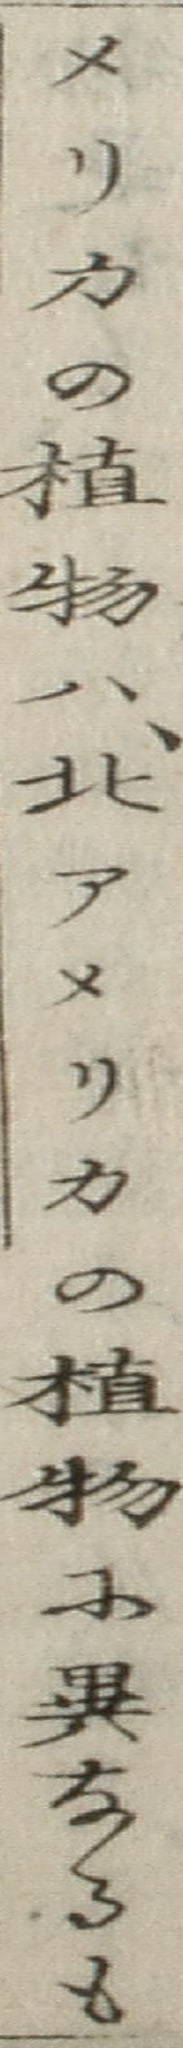メリカの植物は、北アメリカの植物に異なるも
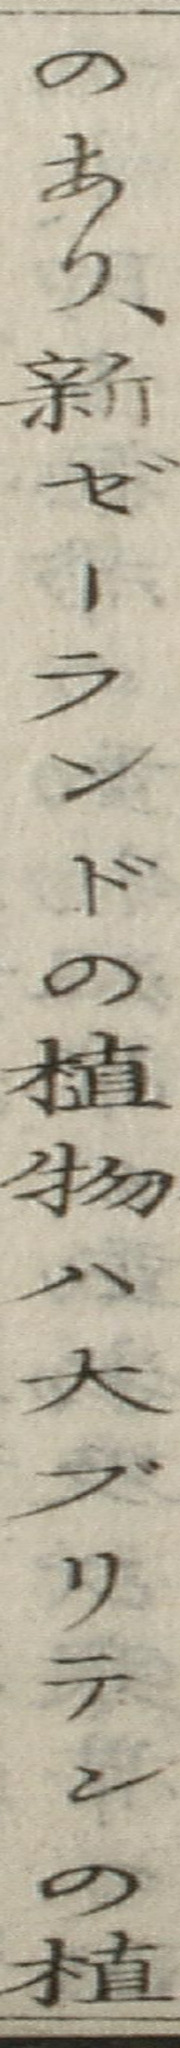のあり、新ゼーランドの植物は大ブリテンの植
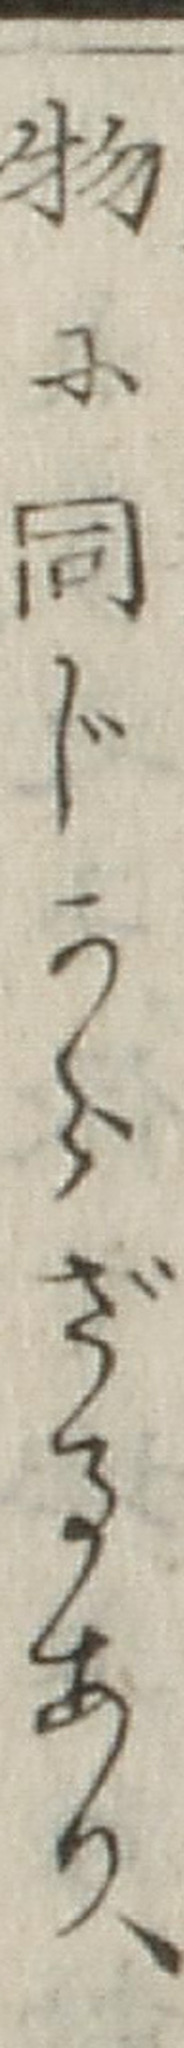物に同じからざるあり、
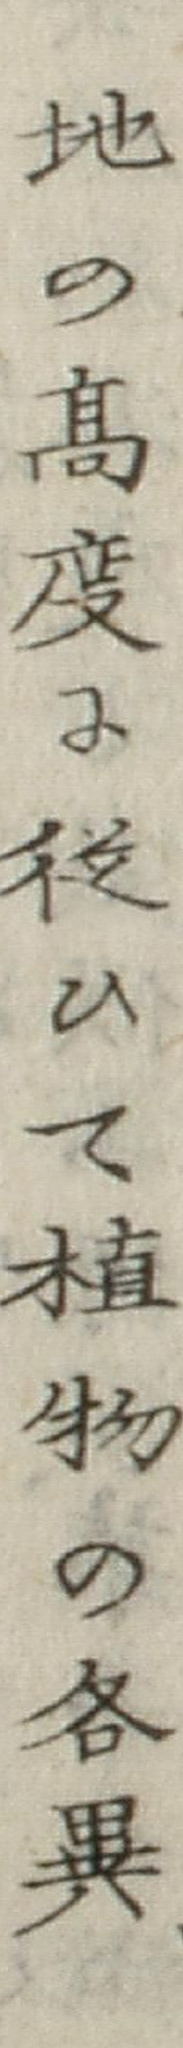地の高度に従ひて植物の各異、
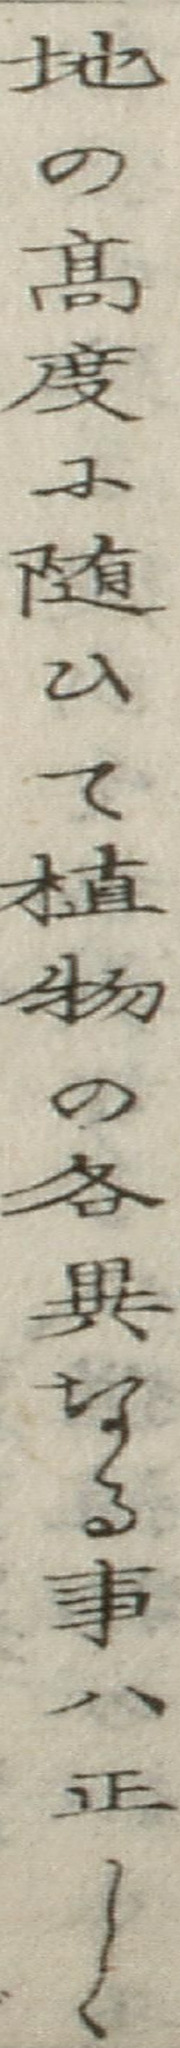地の高度に随ひて植物の各異なる事は、正しく
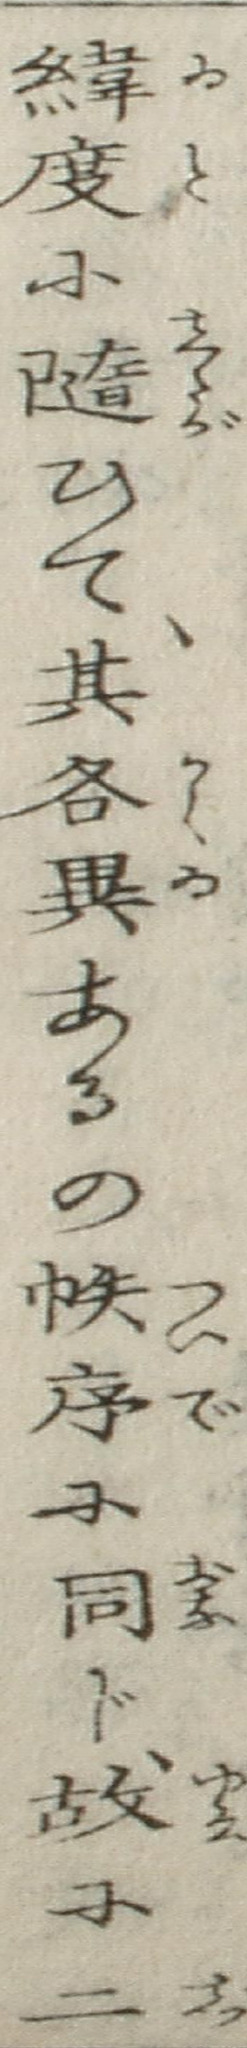緯度に随ひて、其各異あるの帙序に同じ、故に二
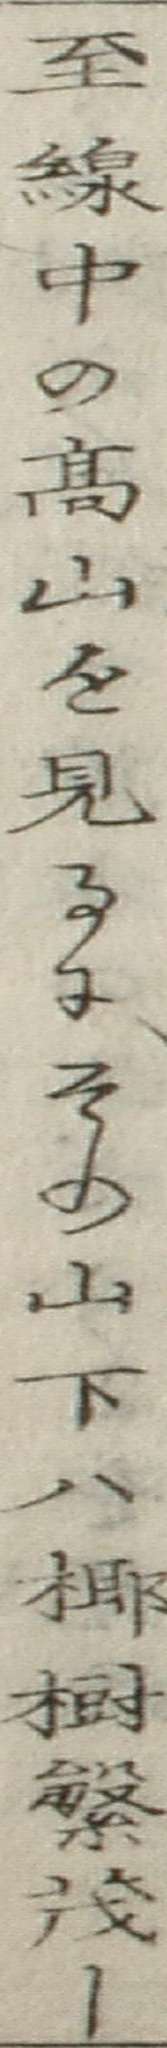至線中の高山を見るに、その山下は椰樹繁茂し
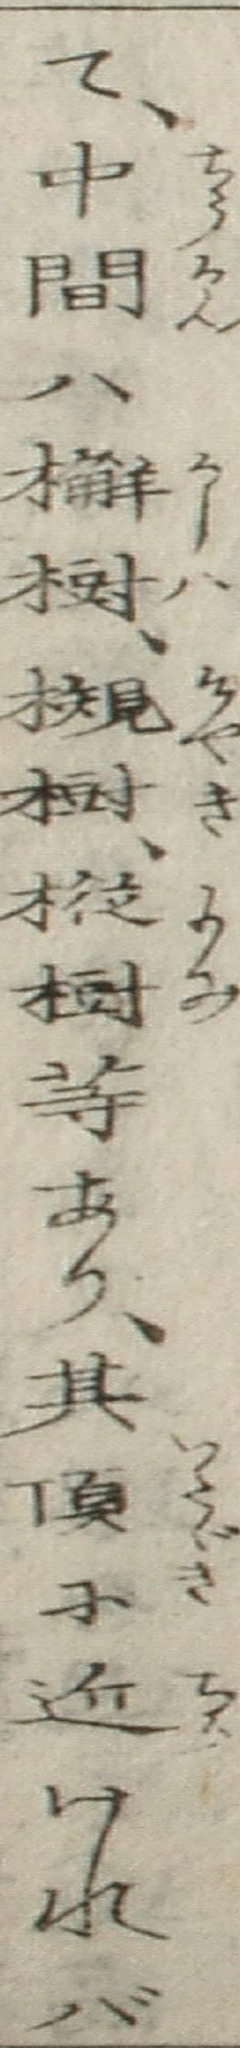て、中間は槲樹、槻樹、樅樹等あり、其頂に近ければ
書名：訓蒙　天然地理學　下
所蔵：東京大学地震研究所図書室 Earthquake Research Institute Library, The University of Tokyo, JAPAN
